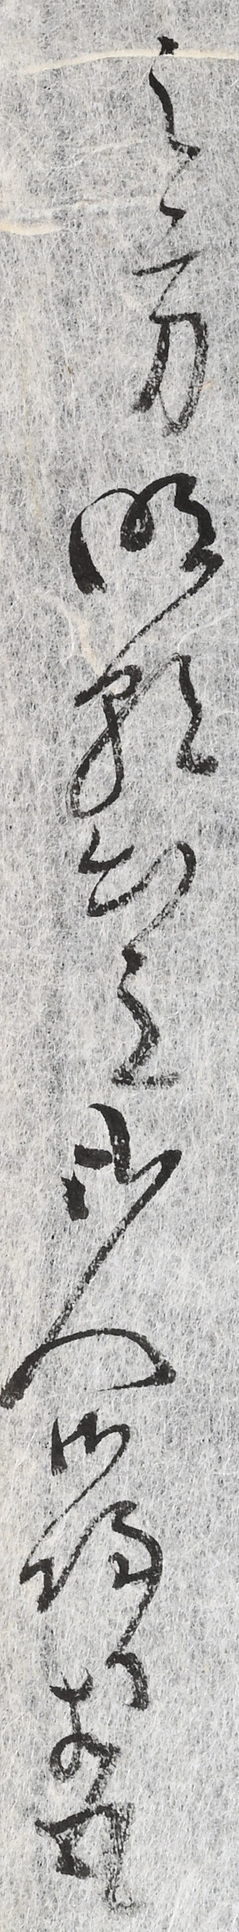之方明朝出立弐人御帰り相成候
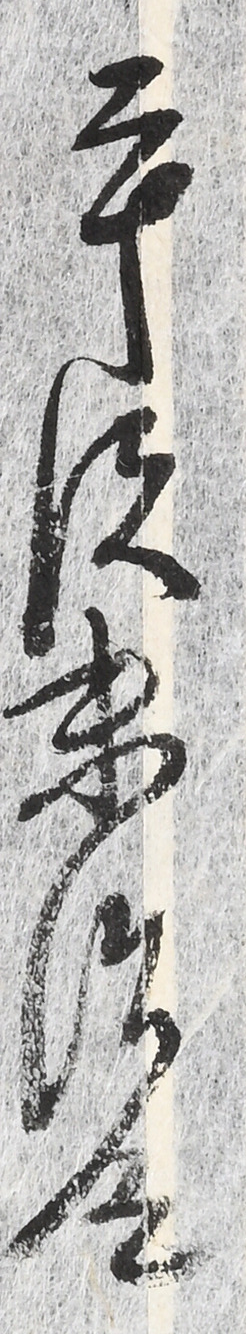平沢末治殿
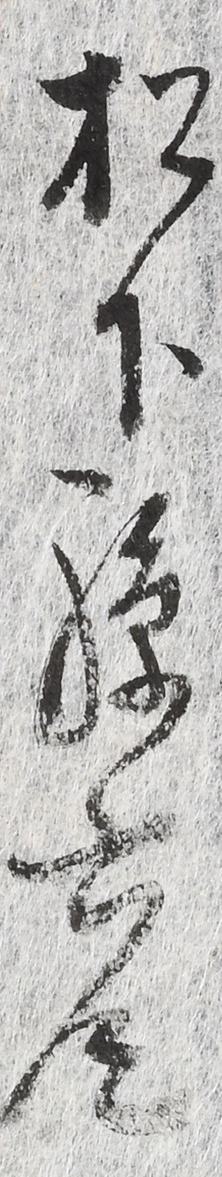松下孫六殿
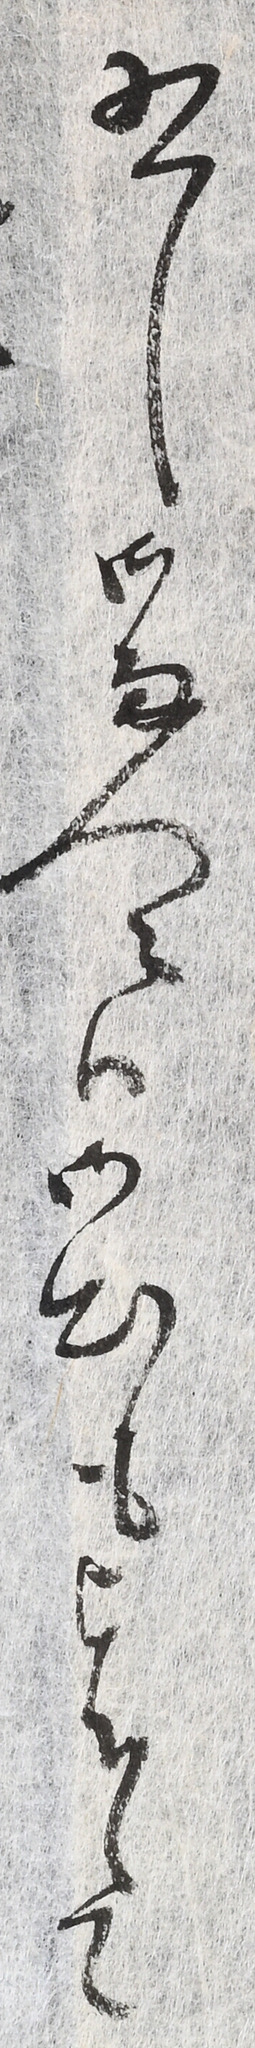右之御両人ニハ御出も被下候ハヽ
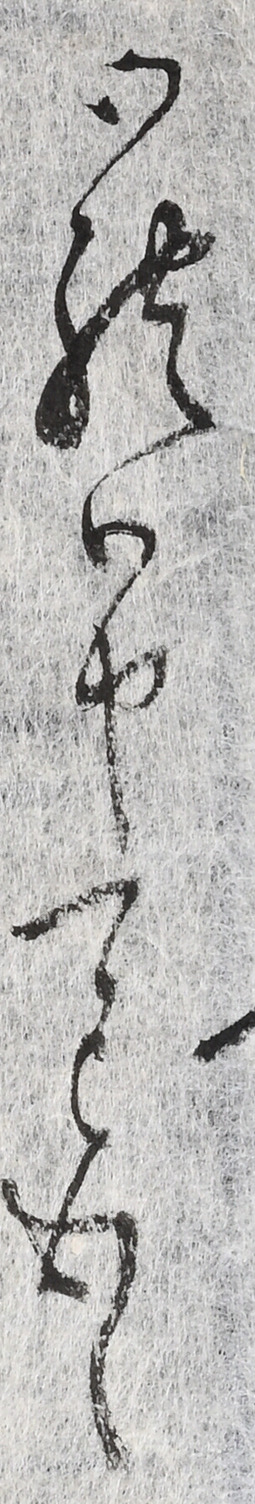御禮御申可被成候
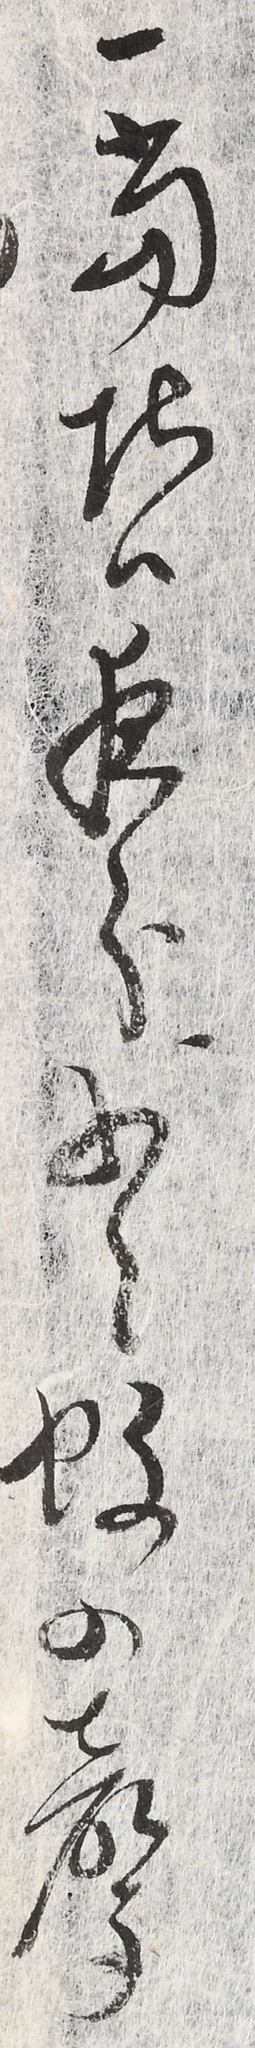一当地ハ夜分少々蚊の聲
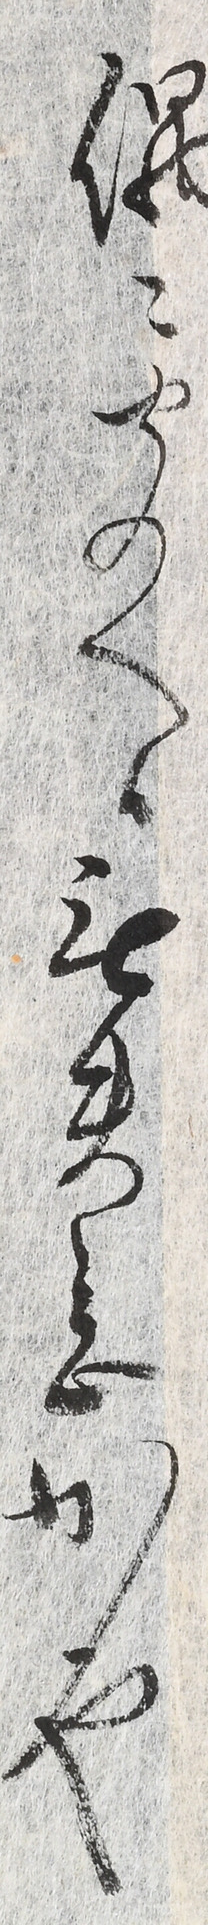偶々聞へ候無失念かや
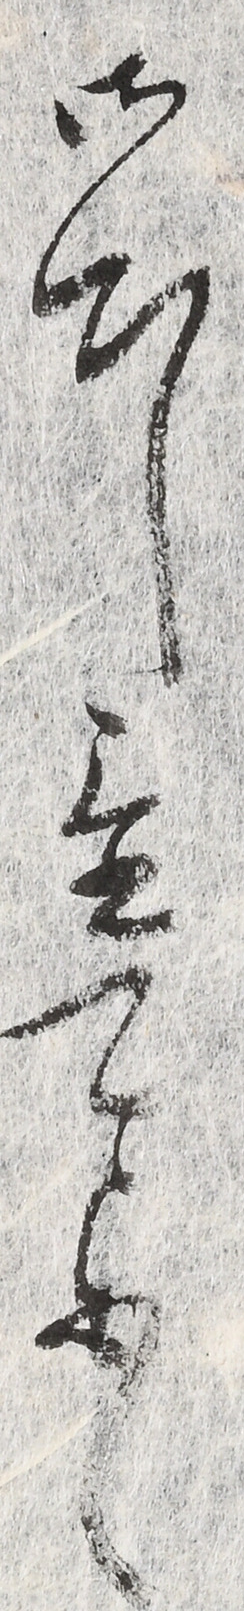御出し置被成候
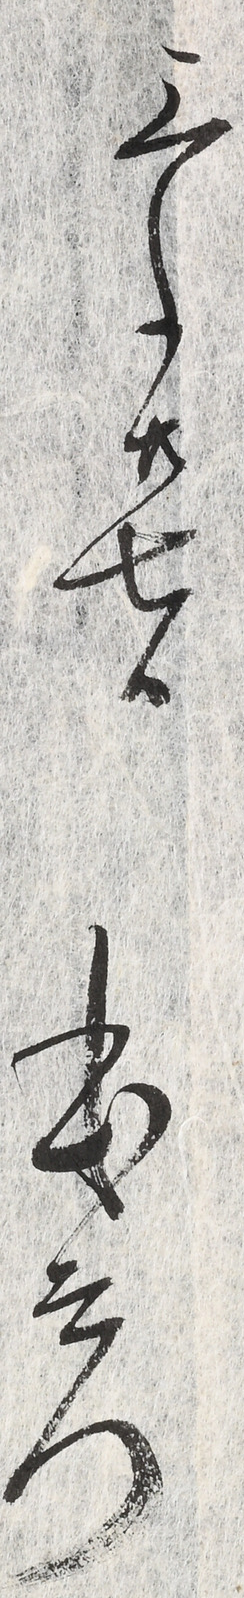三月廿七日本右衛門
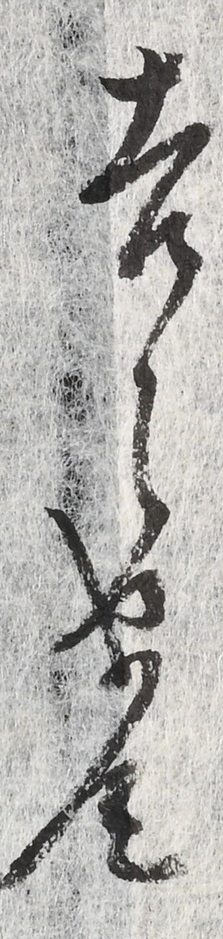吉兵衛殿

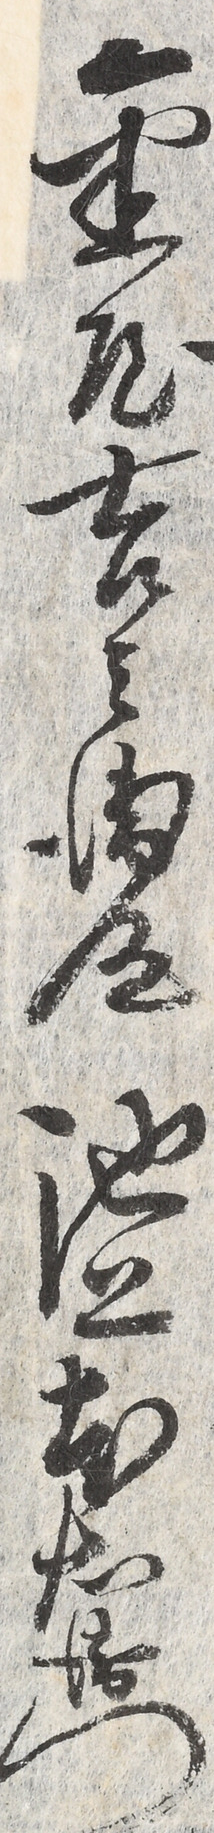金屋玄玄兵衛殿池上本右衛門
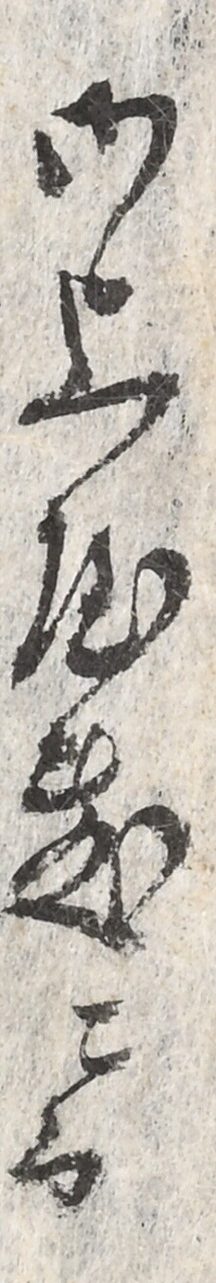御上屋敷ニ而
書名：（書状）
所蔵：伊那市立高遠町図書館・合同会社AMANE
